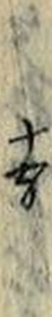十五日
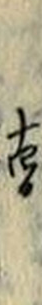十四日
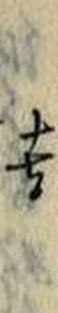十七日
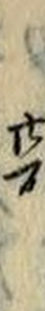廿一日
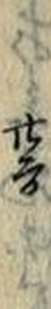廿二日
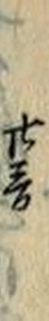廿三日
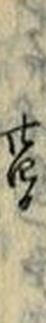廿四日
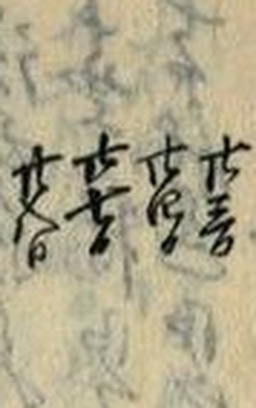廿七日
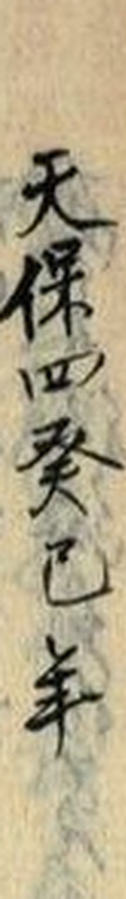天保四癸巳年
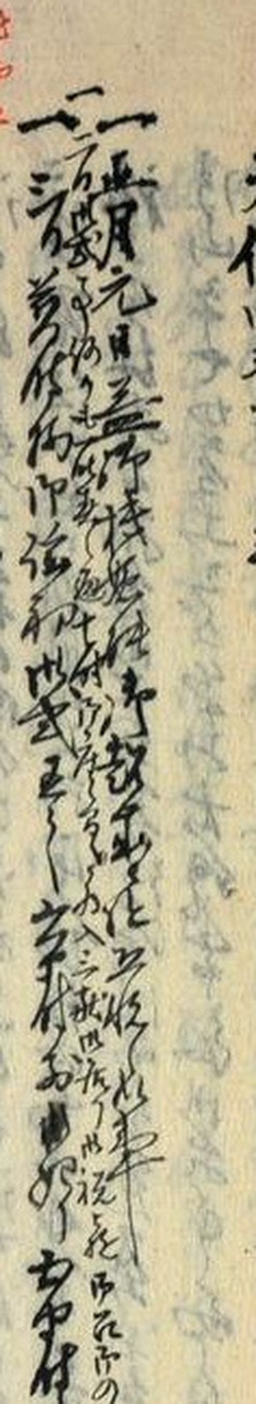一正月元日益御機嫌能御超歳被遊恐悦之御事
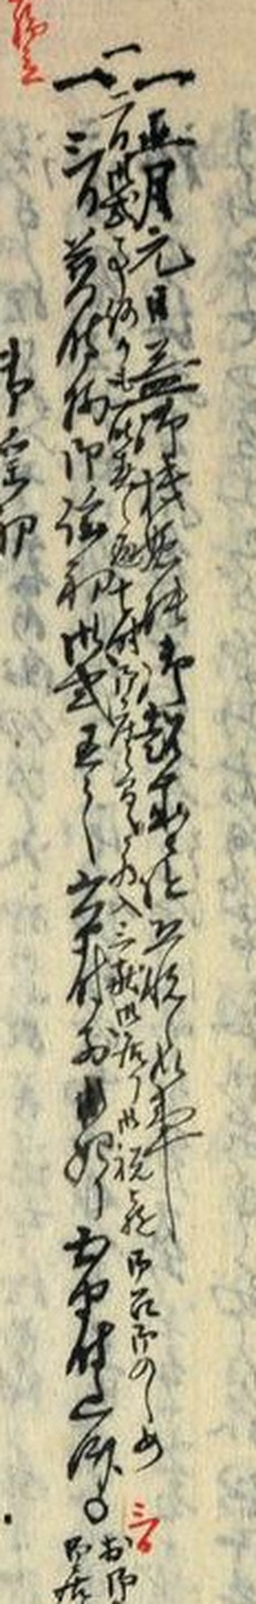一二日御式事何かも一昨春之通七時御座之間へ被為入三献御居り御祝被遊御召御のしめ
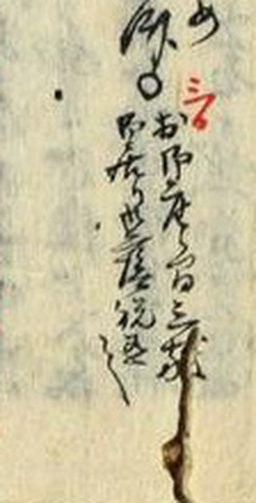御居り御二膳祝有之
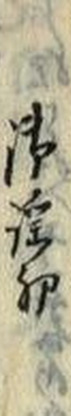御謡初
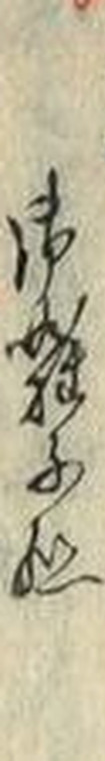御囃子組
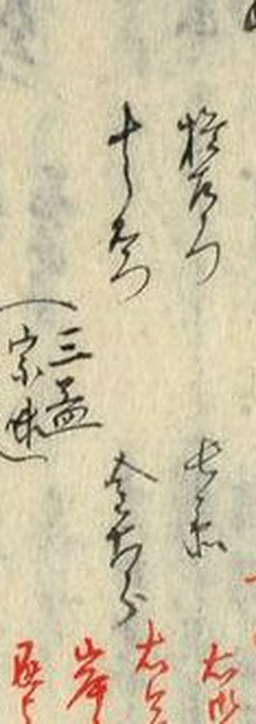十右衛門金太郎

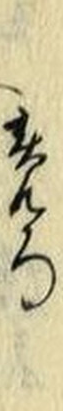良左衛門
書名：少傅日録抄（斉承付側向頭取日記、在国）
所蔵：福井県文書館 Fukui Prefectural Archives
